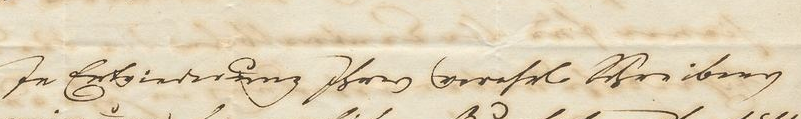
In Erwiederung Ihres verehrl Schreibens
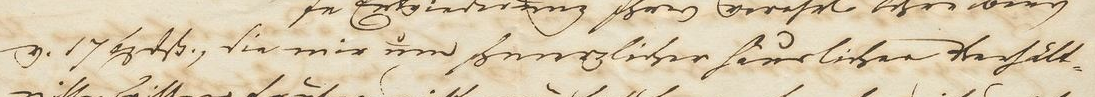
v. 17ten dß., die mir um schmerzlicher häuslicher Verhält-
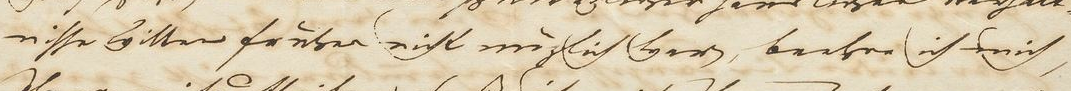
nisse willen früher nicht möglich war, beehre ich mich,
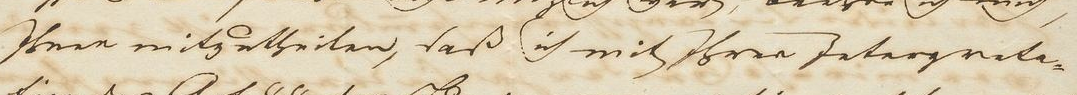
Ihnen mitzutheilen, daß ich mit Ihrer Interpreta-
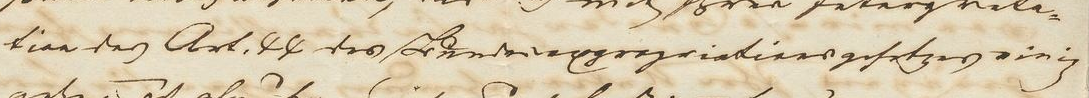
tion des Art. 44 des Bundesexpropriationsgesetzes einig
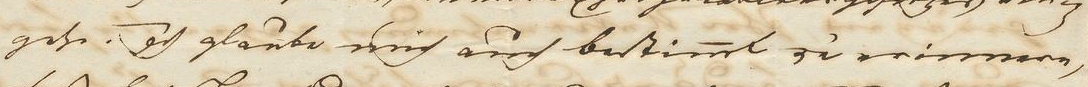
gehe. Ich glaube mich auch bestimmt zu erinnern,
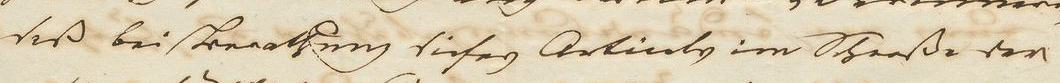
daß bei Berathung dieses Articels im Schooße der
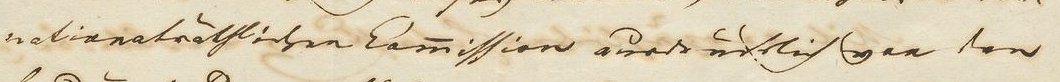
nationalräthlichen Commission ausdrücklich von den
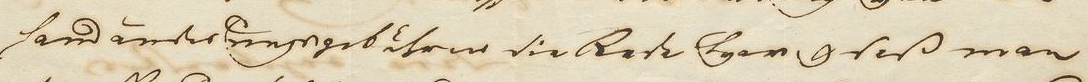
Handänderungsgebühren die Rede war & daß man
